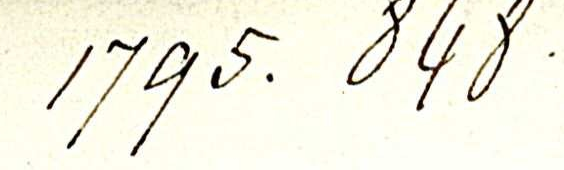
1795. 1848
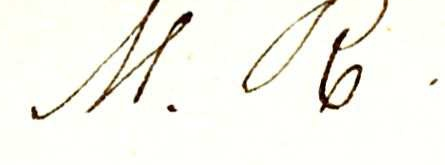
MR
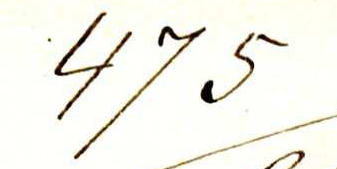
475
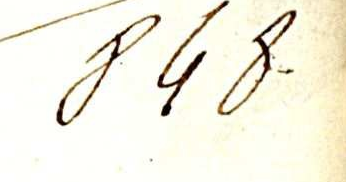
1848
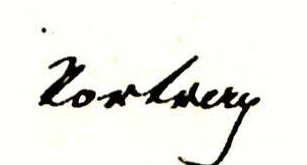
Vortrag
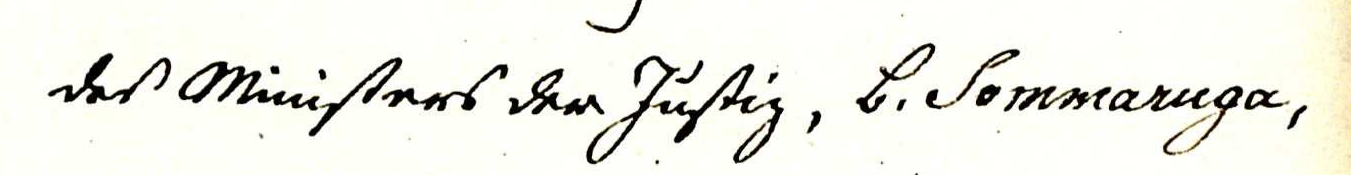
des Ministers der Justiz, B. Sommaruga,
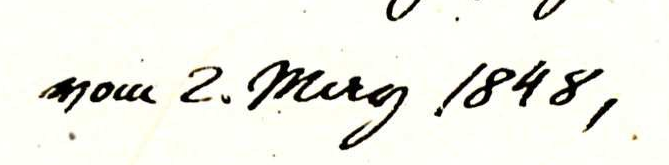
vom 2. May 1848,
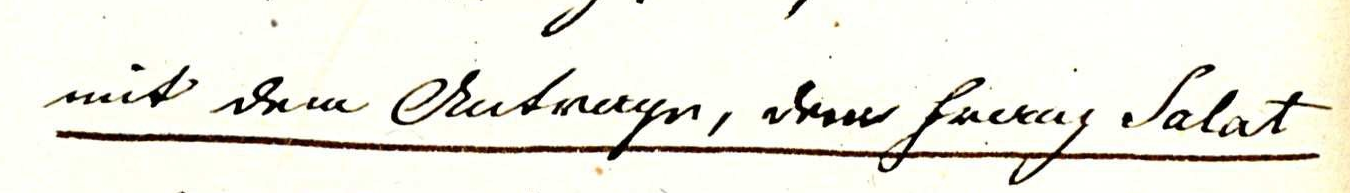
mit dem Antrage, dem Franz Salat
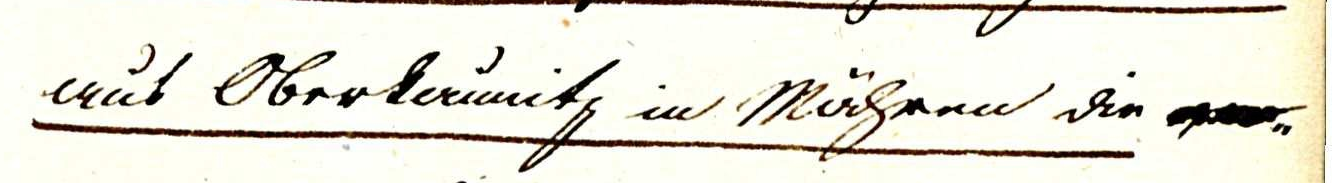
aus Oberkaunitz in Mähren die
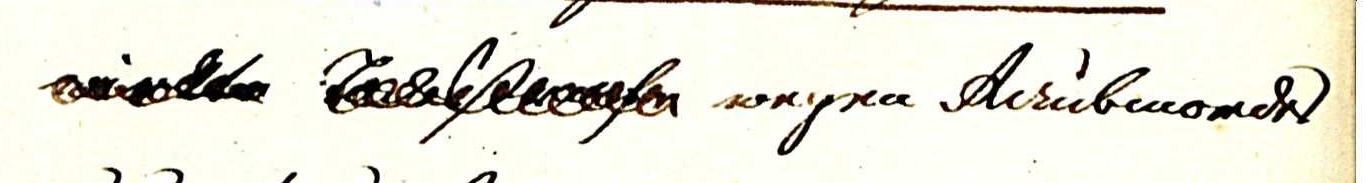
wegen Raubmorde
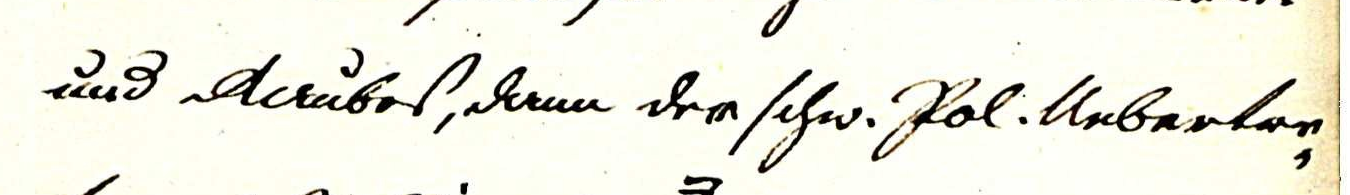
und Raubes, dann der schw. Pol. Uebertre¬
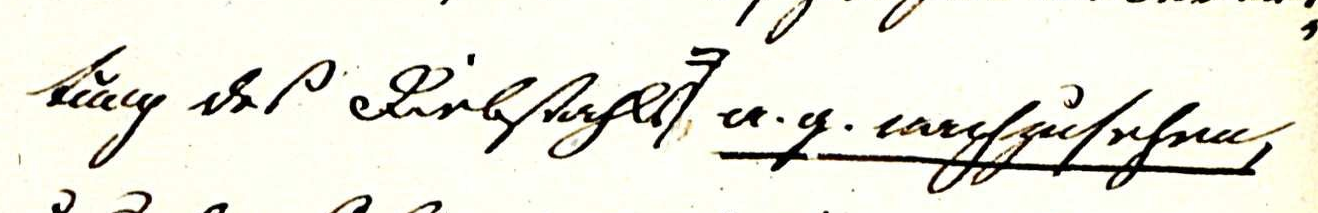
tung des Diebstahls a.g. nachzusehen
